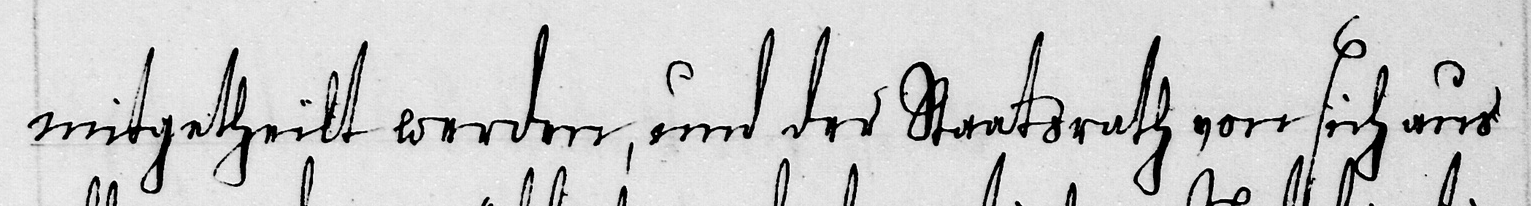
mitgetheilt werden, und der Staatsrath von sich aus
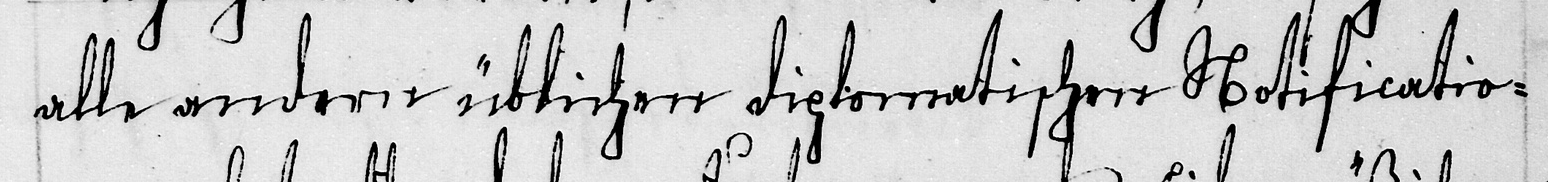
alle andern üblichen diplomatischen Notificatio¬
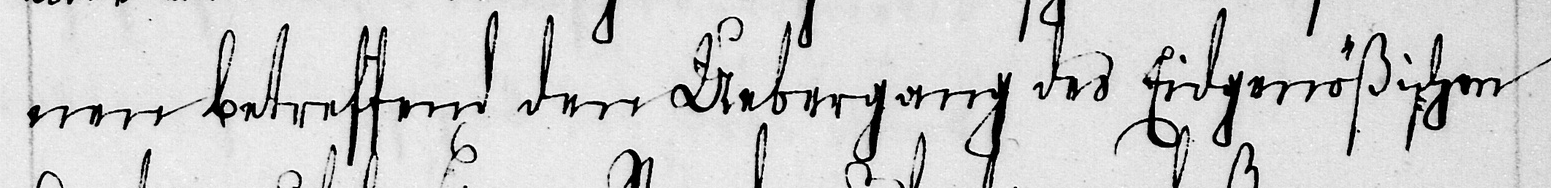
nen betreffend den Uebergang des Eidgenößischen
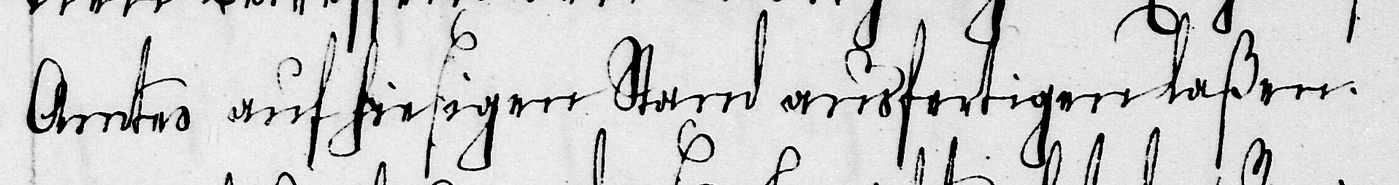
Amtes auf hiesigen Stand ausfertigen laßen.
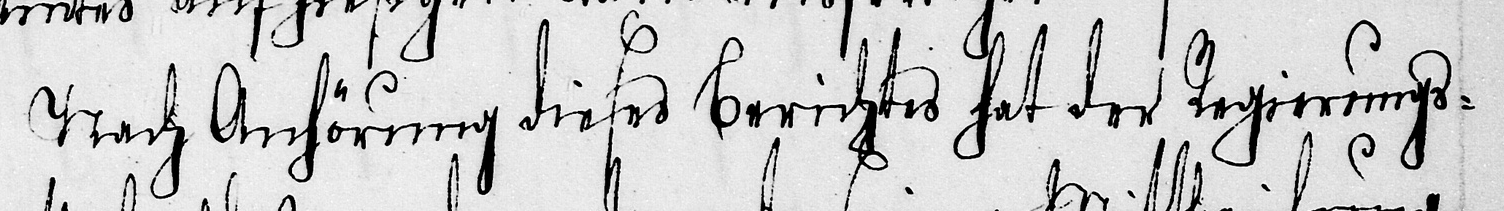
Nach Anhörung dieses Berichtes hat der Regierungs¬
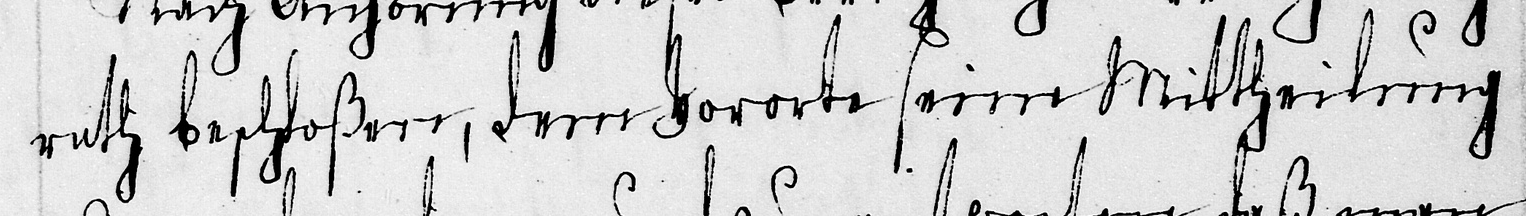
rath beschloßen, dem Vororte seine Mittheilung
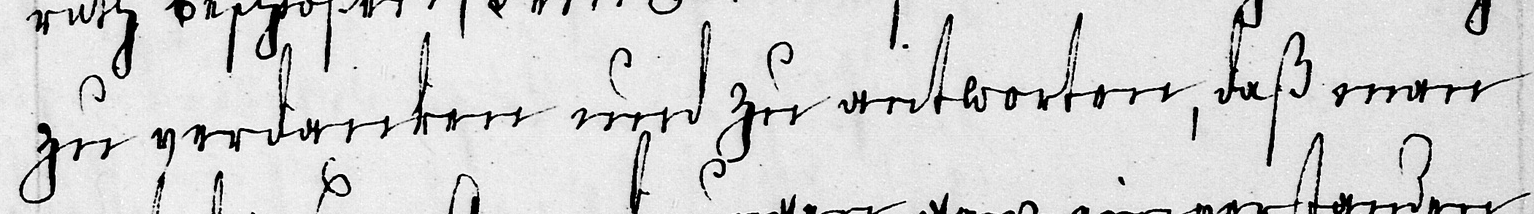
zu verdanken und zu antworten, daß man
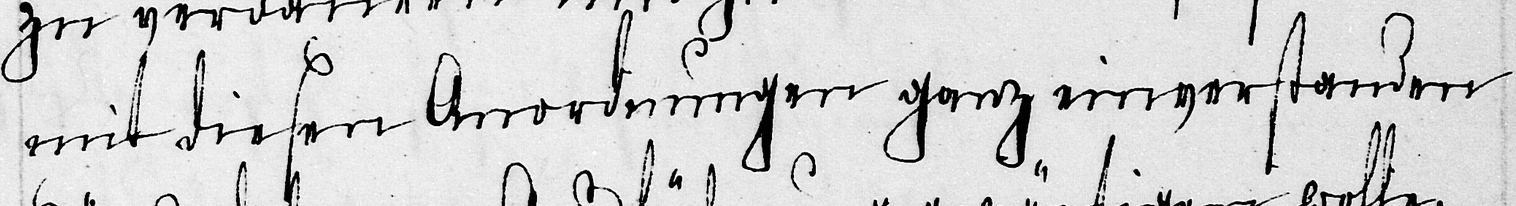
mit diesen Anordnungen ganz einverstanden
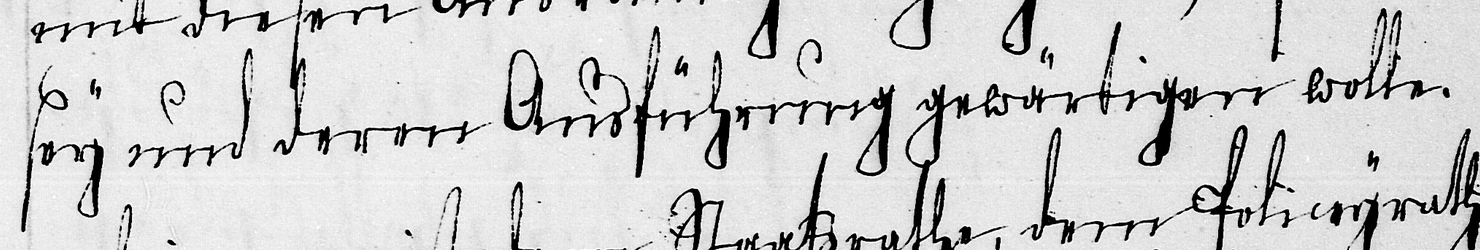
sey und deren Ausführung gewärtigen wolle.
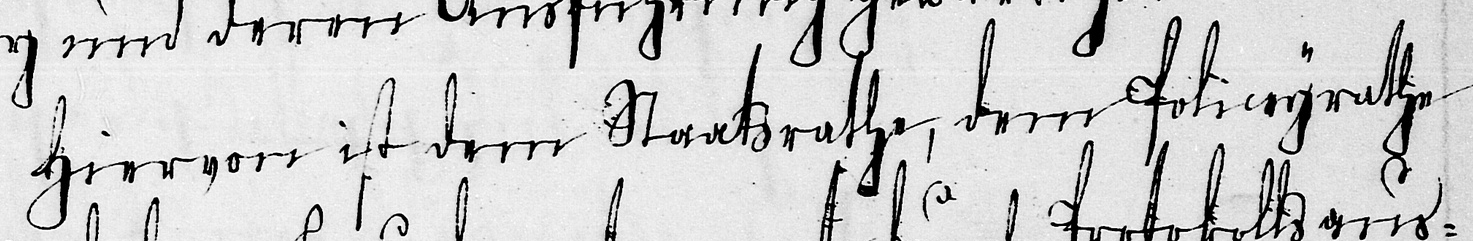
Hiervon ist dem Staatsrathe, dem Policeyrathe
